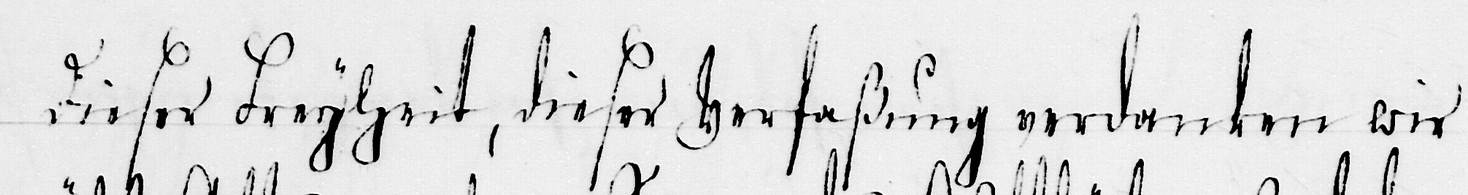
Dieser Freyheit, dieser Verfaßung verdanken wir
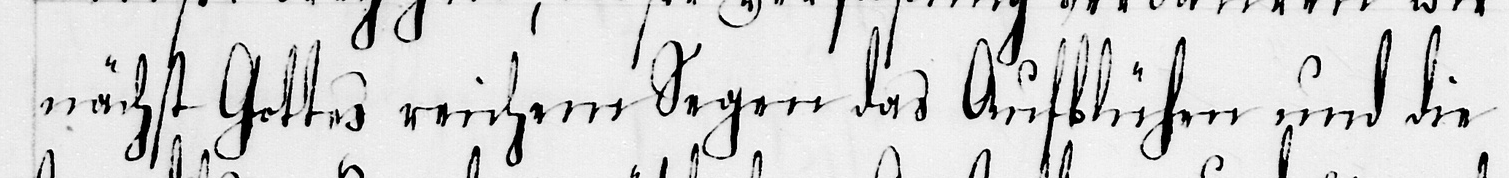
nächst Gottes reichem Segen das Aufblühen und die
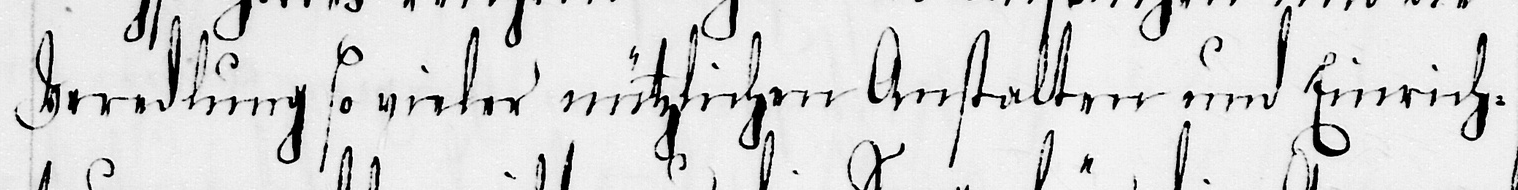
Veredlung so vieler nützlichen Anstalten und Einrich¬
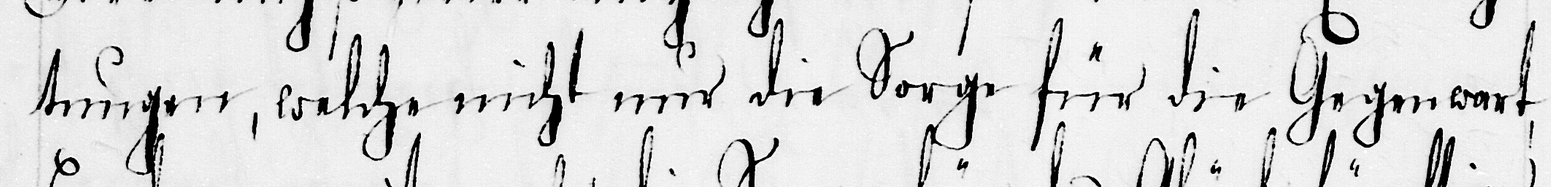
tungen, welche nicht nur die Sorge für die Gegenwart,
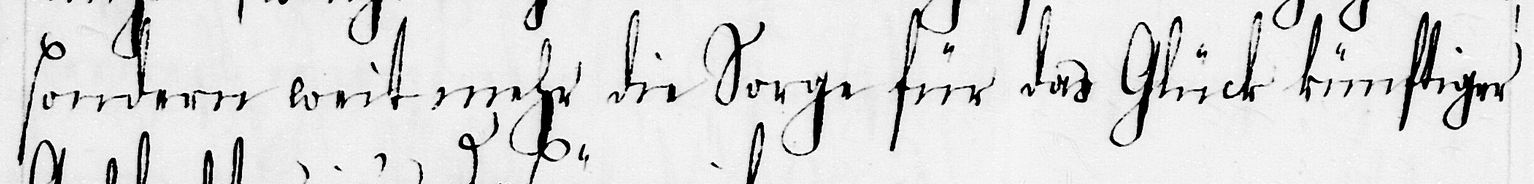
sondern weit mehr die Sorge für das Glück künftiger
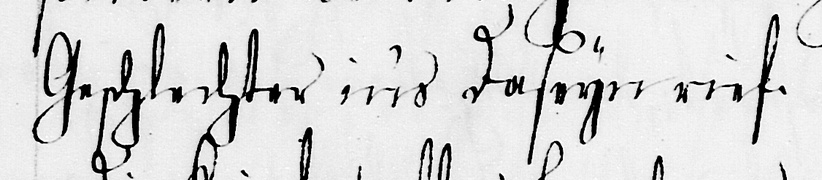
Geschlechter in’s Daseyn rief.
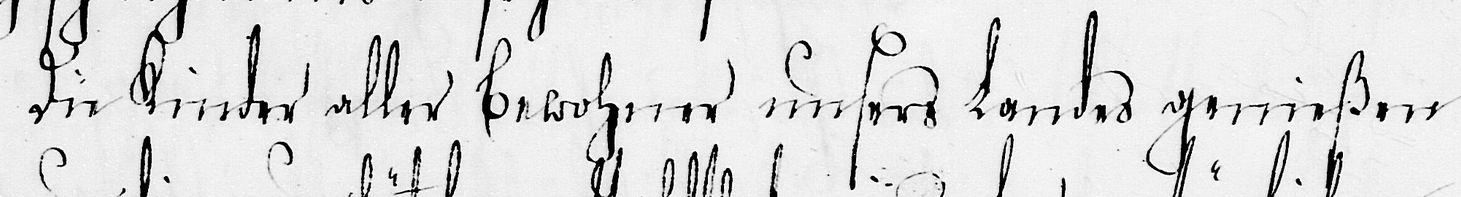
Die Kinder aller Bewohner unsers Landes genießen
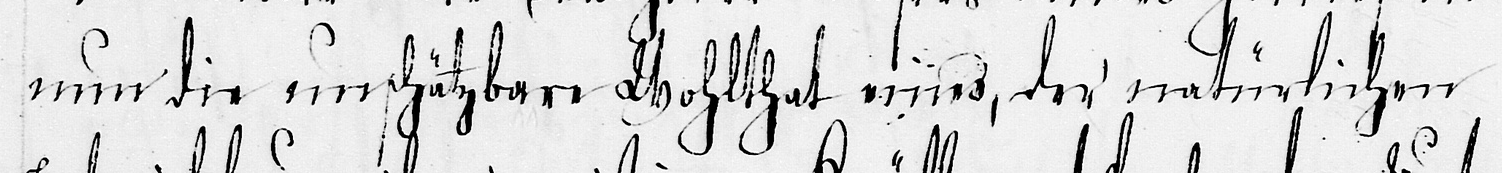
nun die unschätzbare Wohlthat eines, der natürlichen
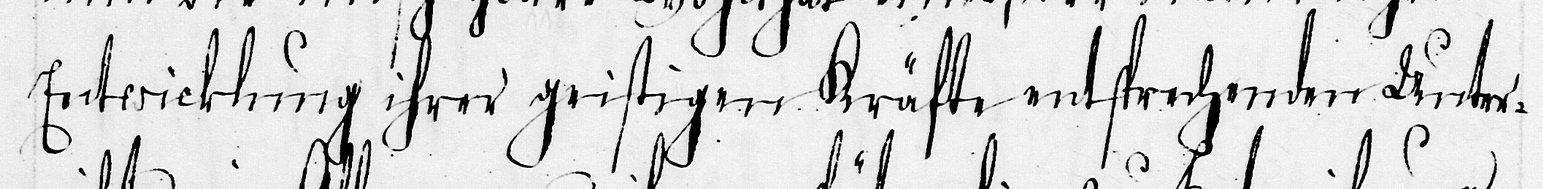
Entwicklung ihrer geistigen Kräfte entsprechenden Unter¬
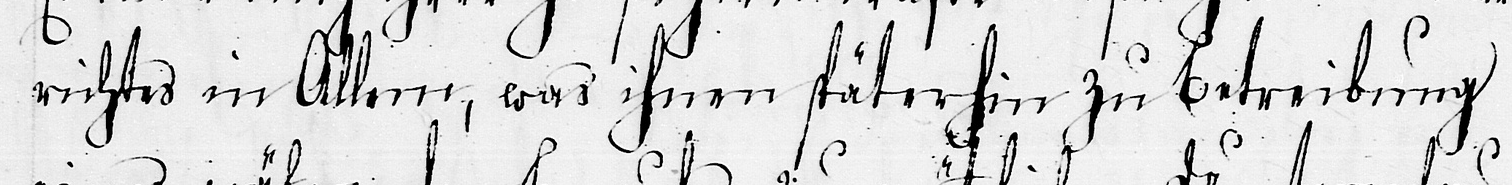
richtes in Allem, was ihnen späterhin zu Betreibung
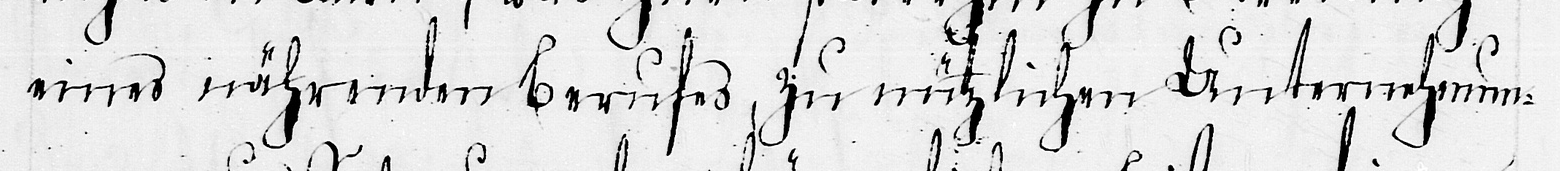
eines nährenden Berufes, zu nützlichen Unternehmun¬
